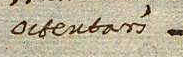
oitenta rs̄
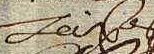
Teixra
